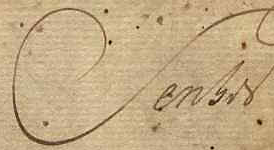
Senhor.
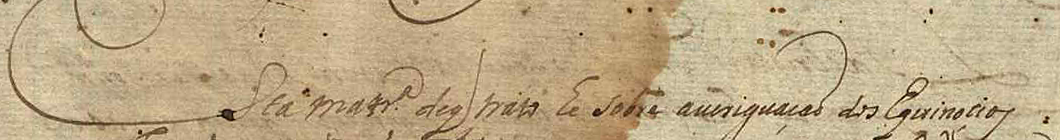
Esta matr.a de q̄ trato he sobre aueriguaçaõ dos Equinoçios
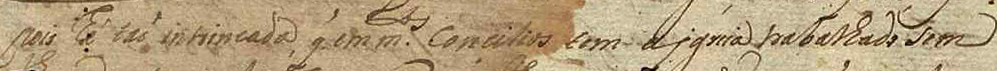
pois hé taõ intrincada, q̄ em m.tos Concilios tem a jgreia trabalhado sem
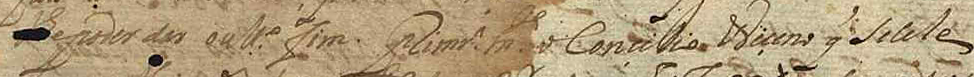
lhe poder dar o ult.o fim pRimr.am.te o Concilio Niçeno q̄ se cele
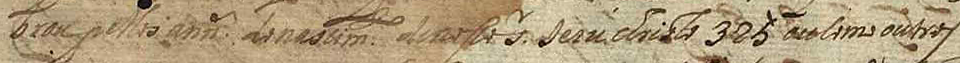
brou pellos ann.s do nascim.to de nosso s.r Iesu christo 325 ou Como outros
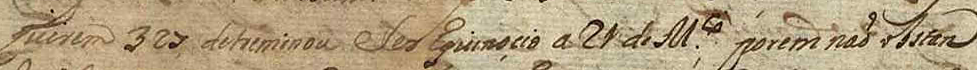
querem 327, detreminou Ser Equinocio a 21 de M.ço porem naõ obstan
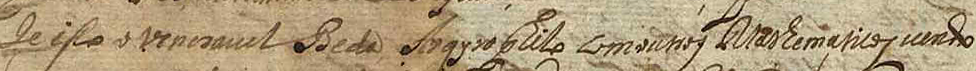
te isso o venerauel Beda, Argyrophilo com outros Mathematicos uendo
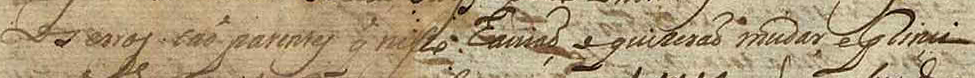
os erros taõ parentes q̄ nisto hauiaõ, e quizeraõ mudar e pRinci
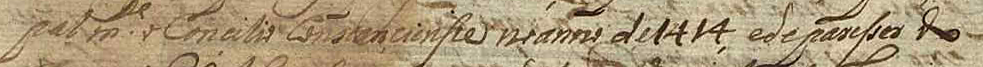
palm.te o Concilio Constanciensse no anno de 1414, e de paresser do
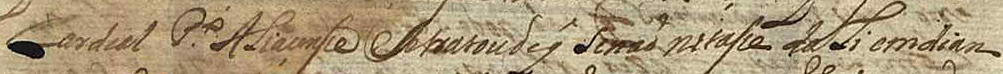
Cardeal P.e Aliaçensse se tratou de q̄ se naõ notasse dali em dian
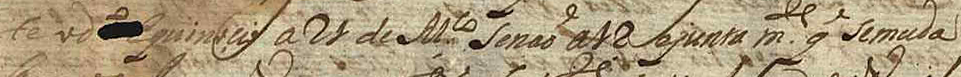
te o d.o Equinoçio a 21 de M.co senaõ a 12 e juntam.te q̄ se muda
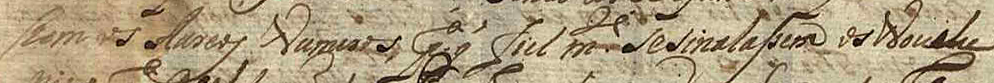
ssem os Aureos Numeros, p.a q̄ fielm.te se sinalassem os Nouelu
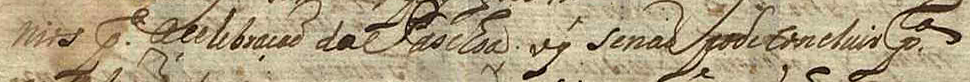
nios p.a a celebraçaõ da Paschoa; o q̄ se naõ pode concluir p.la
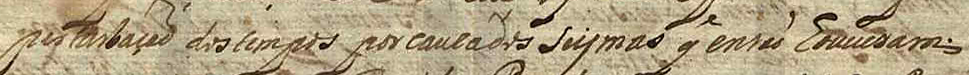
perturbaçaõ dos tempos por cauza dos seismas q̄ entaõ houueram.
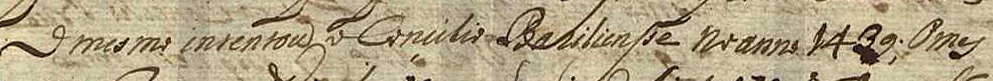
O mesmo intentou o Concilio Baziliensse no anno 1439. O mes
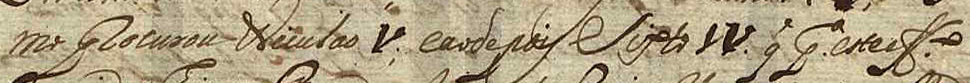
mo pRocurou Niculao V; e ao depois Sixto 1V. q̄ p.a este eff.o
